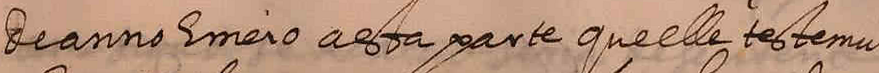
de anno E meio a esta parte que elle testemu
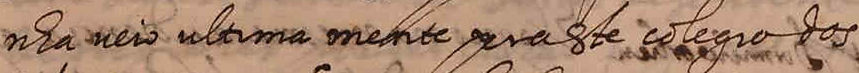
nha ueio ultimamente pera este colegio dos
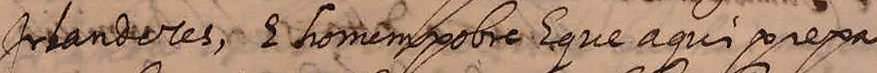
Jrlandezes, E homem pobre E que aqui prepa
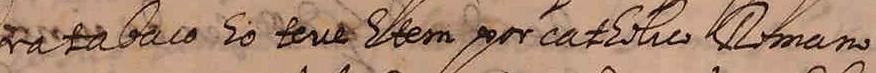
ra tabaco E o teue E tem por catholico Romano
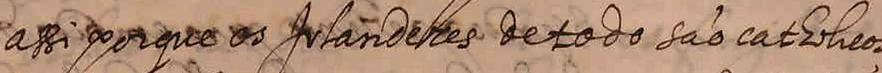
assi porque os Jrlandezes de todo saõ catholicos
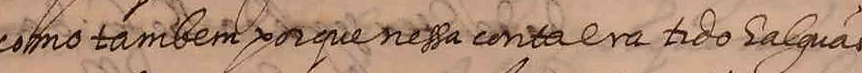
como tambem porque nessa conta era tido E alguās
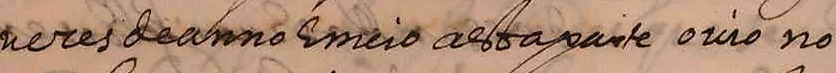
uezes de anno E meio a esta parte o uio no
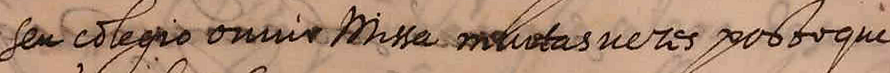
seu colegio ouuir Missa muitas uezes posto que
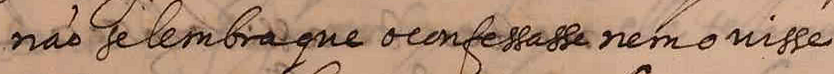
naõ se lembra que o confessasse nem o uisse
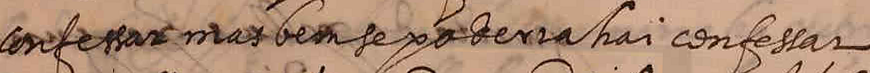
confessar mas bem se podera hai confessar
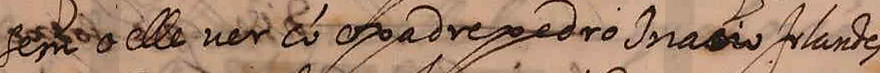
sem o elle uer cō o padre pedro Inacio Jrlandes
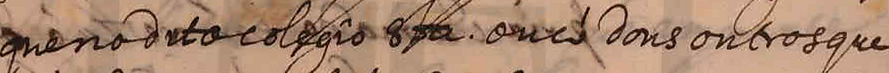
que no dito colegio esta. ou cō dous outros que
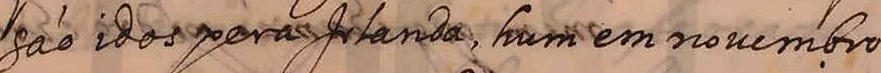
saõ idos pera Jrlanda, hum em nouembro
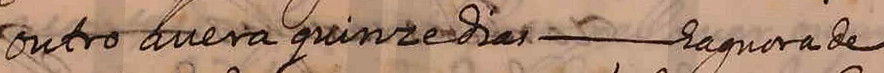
outro auera quinze dias _____ E aguora de
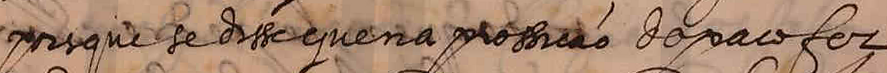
pois que se disse que na prossicaõ do paco fez
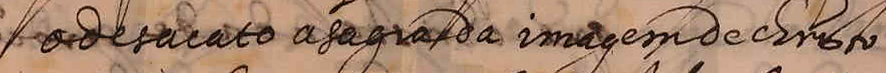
o desacato a sagrada imagem de christo
